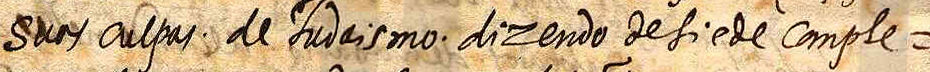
Suas culpas de Iudaismo. dizendo de si e de comple
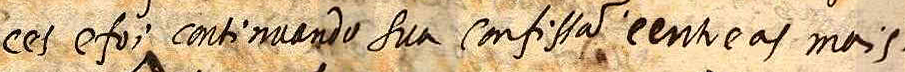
ces e foi continuando sua confissaõ e entre as mais
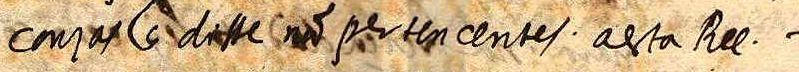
cousas q̄ disse não pertencentes a esta Ree.
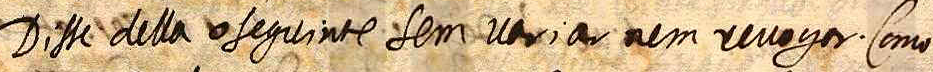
Disse della o seguinte sem uariar nem reuogar Como
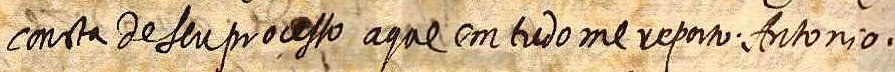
consta de seu processo a que em tudo me reporto. Antonio
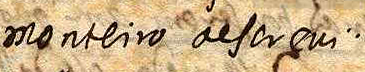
monteiro o escreui.
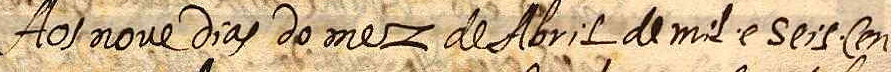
Aos noue dias do mez de AbriL de mil e SeisCen
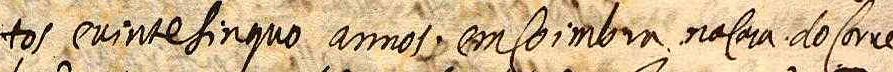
tos e uinte sinquo annos em Coimbra na Caza do Corre
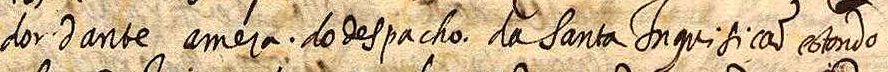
dor dante a meza do despacho da Santa Inquisiçaõ estando
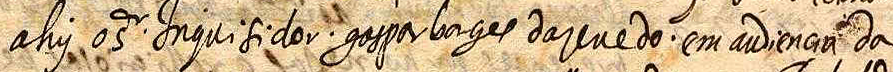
ahy o sor. Inquisidor gaspar borges dazeuedo em audiencia da
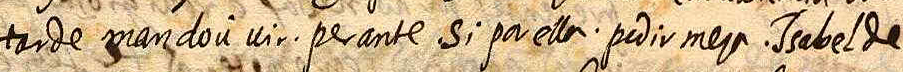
tarde mandou uir perante si por ella pedir meza Isabel de
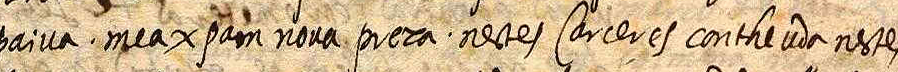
paiua mea xpam noua preza nestes Carceres contheuda nestes
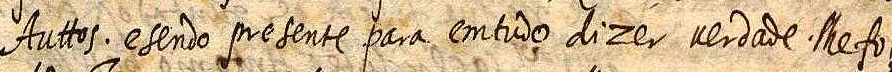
Auttos. e sendo presente para em tudo dizer uerdade lhe foi
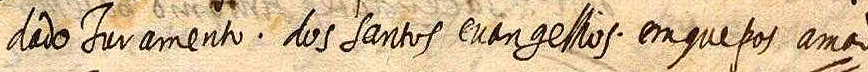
dado Iuramento dos santos euangelhos em que pos a maõ
